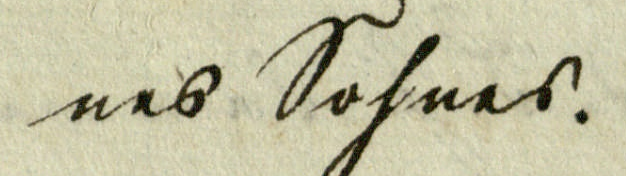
nes Sohnes.
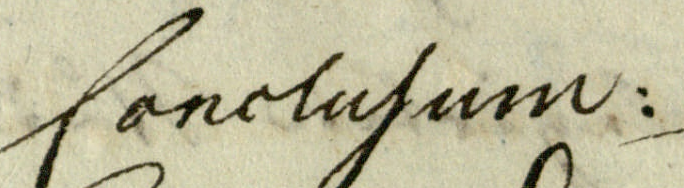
Conclusum:
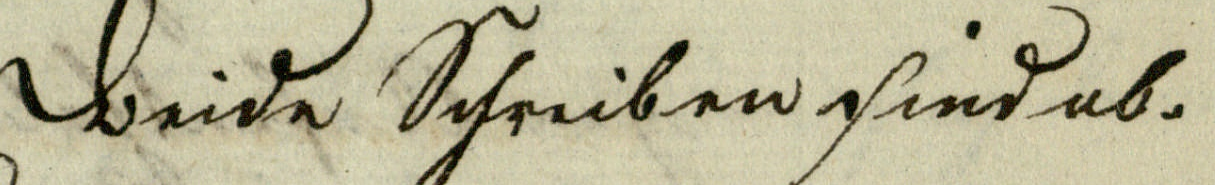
Beide Schreiben sind ab¬
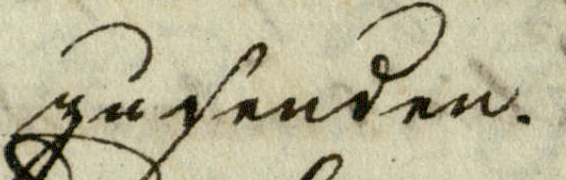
zusenden.
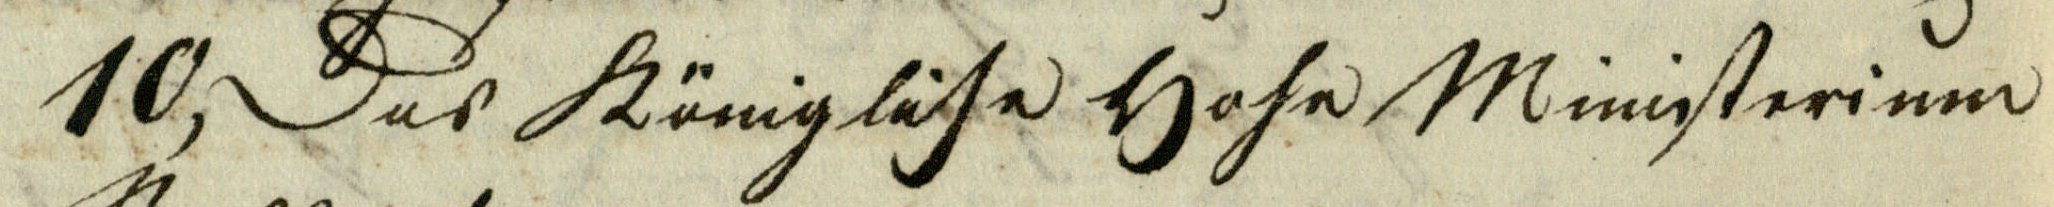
10, Das Königliche Hohe Ministerium
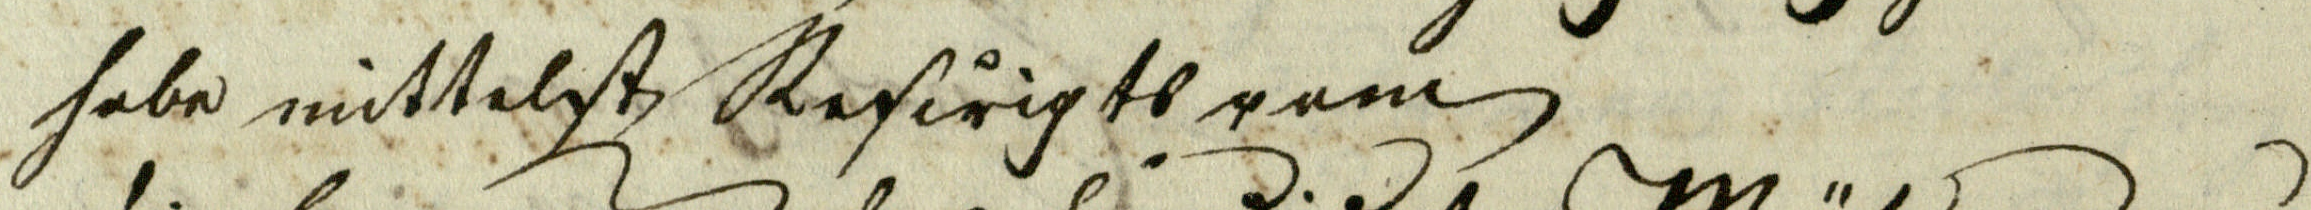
habe mittelst Rescripts vom
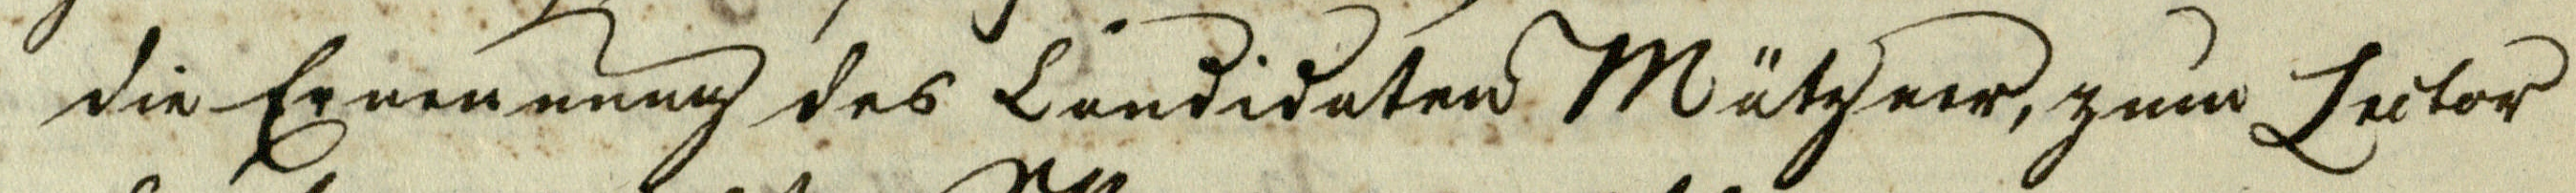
die Ernennung des Candidaten Mätzner, zum Lector
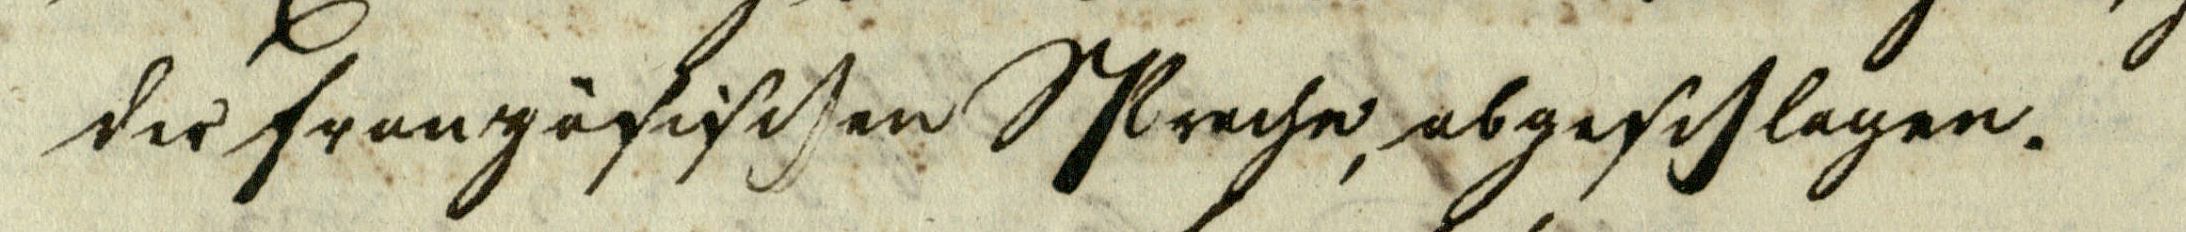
der französischen Sprache, abgeschlagen.
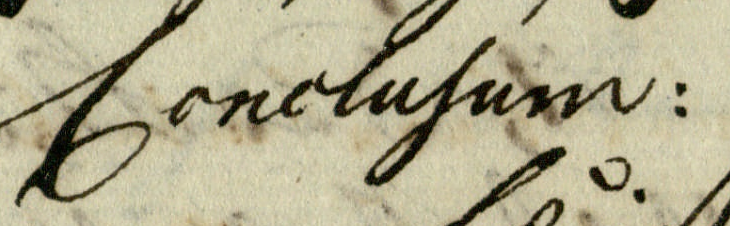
Conclusum:
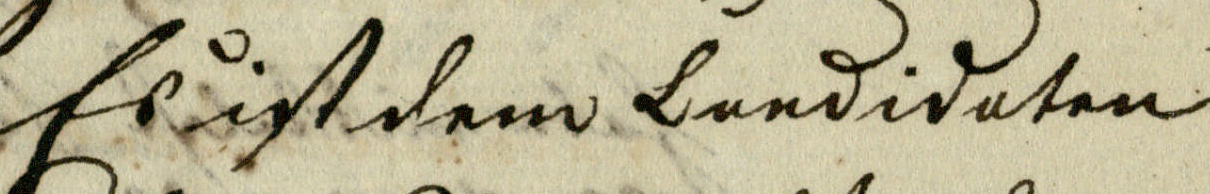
Es ist dem Candidaten
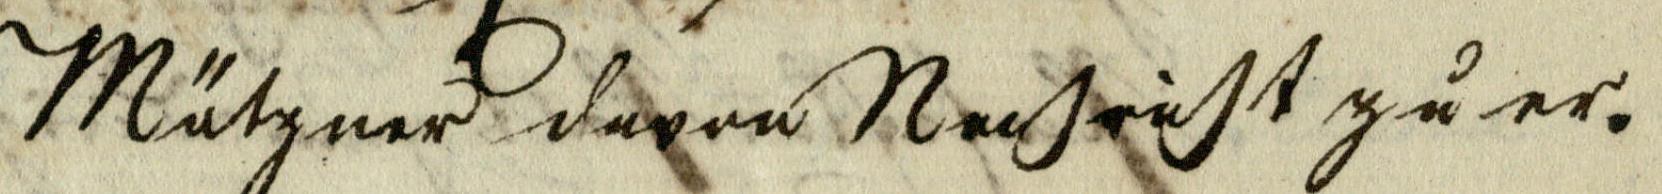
Mätzner davon Nachricht zu er¬
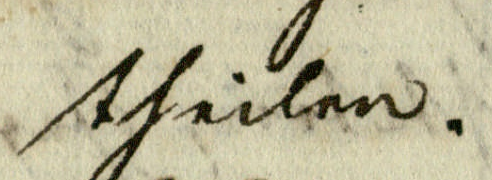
theilen.
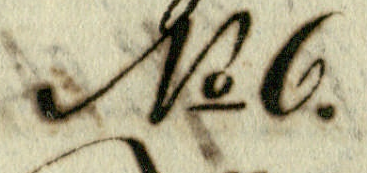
No 6.
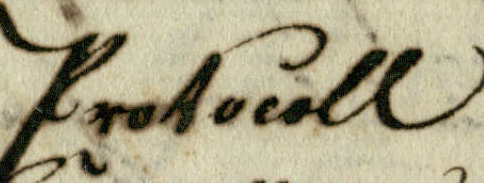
Protocoll
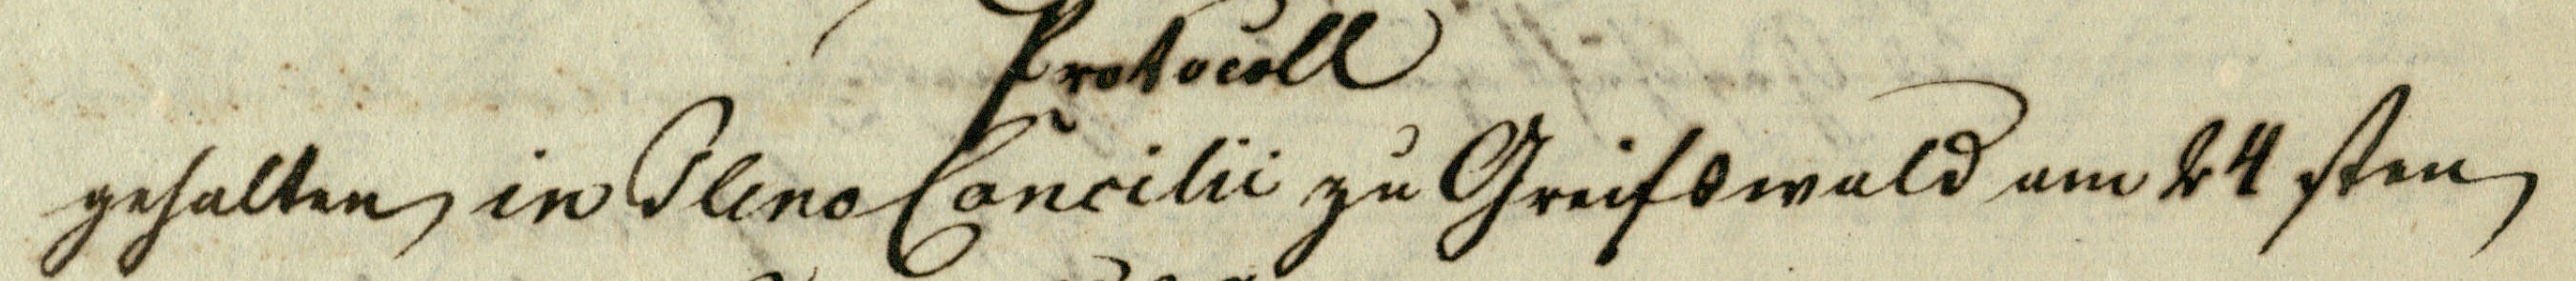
gehalten in Pleno Concilii zu Greifswald am 24 sten
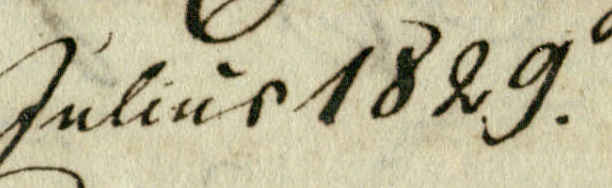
Julius 1829.
